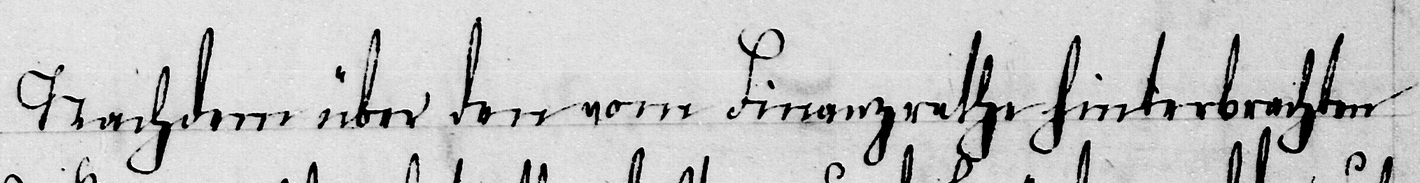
Nachdem über den vom Finanzrathe hinterbrachten
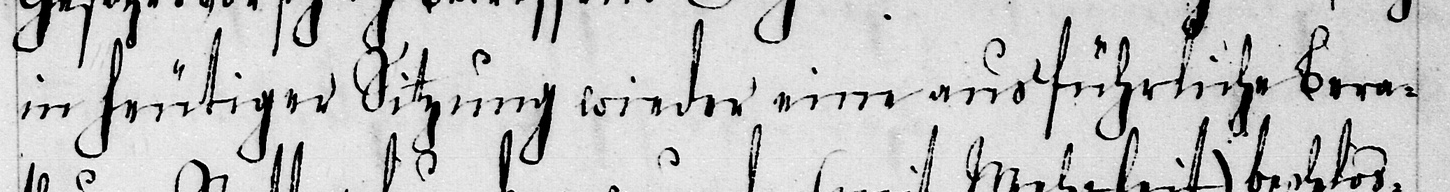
in heutiger Sitzung wieder eine ausführliche Bera¬
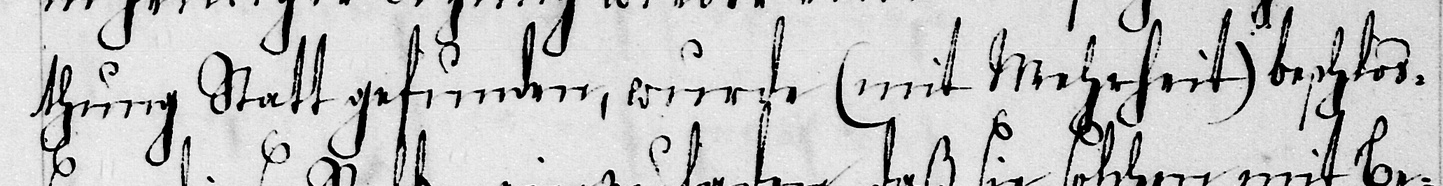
thung Statt gefunden, wurde (mit Mehrheit) beschloß¬
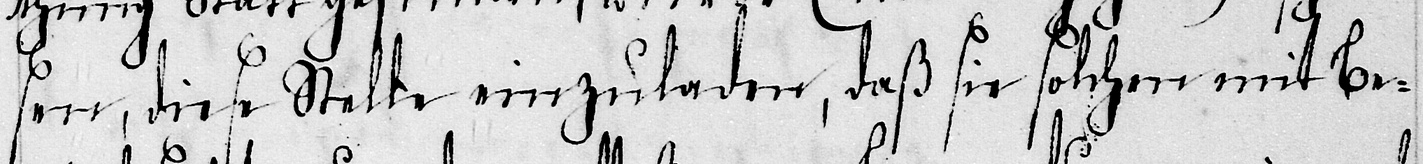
en, diese Stelle einzuladen, das sie solchen mit Be¬
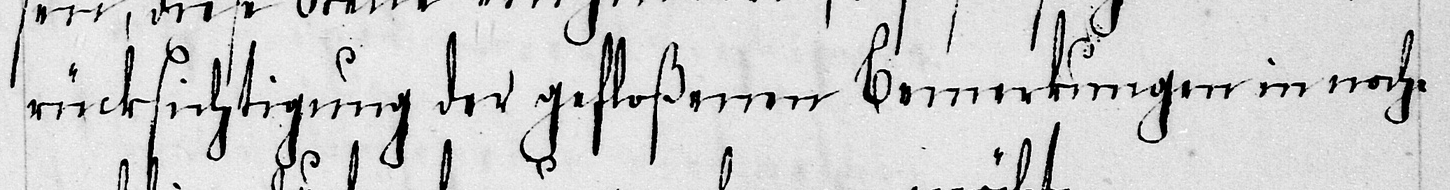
rücksichtigung der gefloßenen Bemerkungen in noch¬
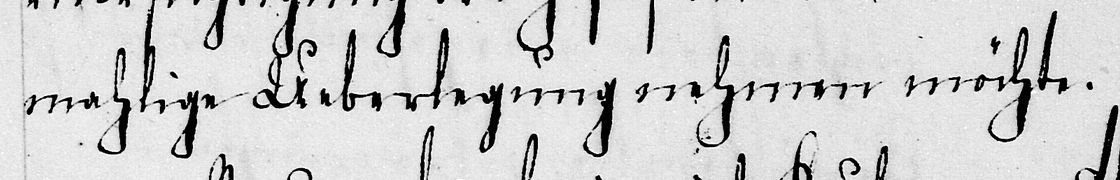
mahlige Ueberlegung nehmen möchte.
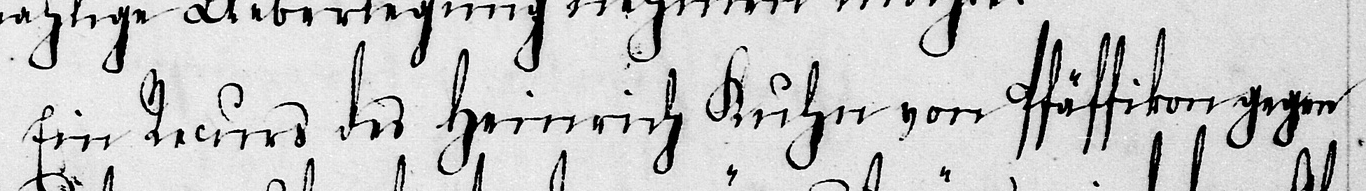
Ein Recurs des Heinrich Kuhn von Pfäffikon gegen
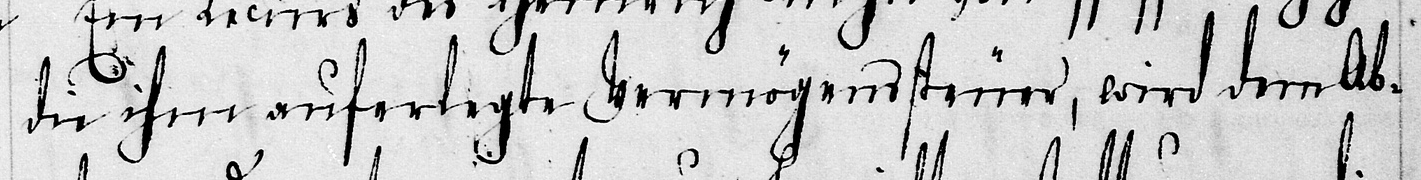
die ihm auferlegte Vermögenssteuer, wird dem Ab¬
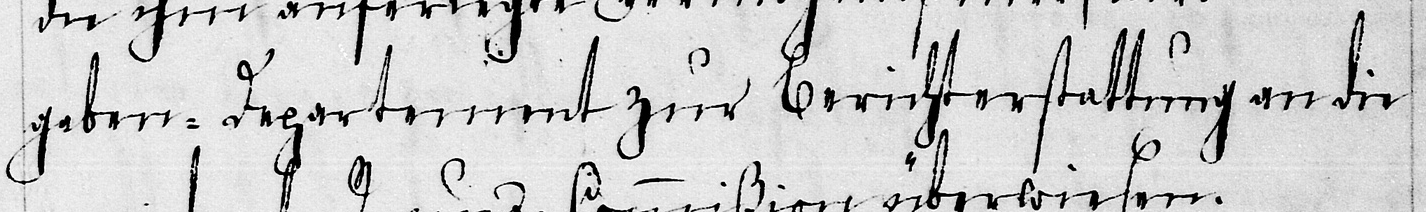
gaben-Departement zur Berichterstattung an die
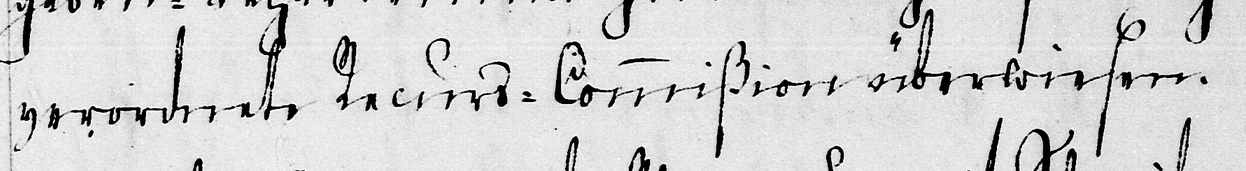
verordnete Recurs-Commißion überwiesen.
